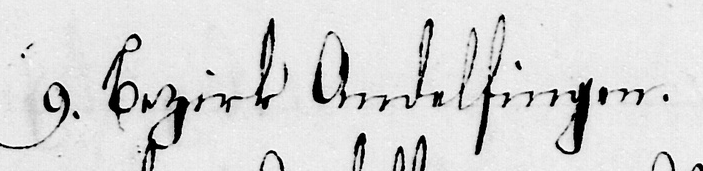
9. Bezirk Andelfingen.
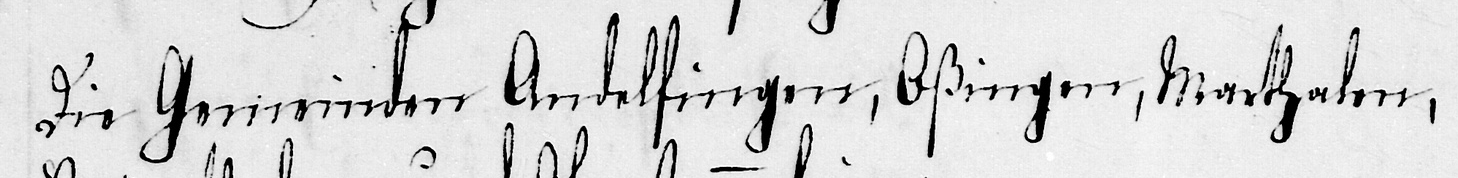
Die Gemeinden Andelfingen, Oßingen, Marthalen,
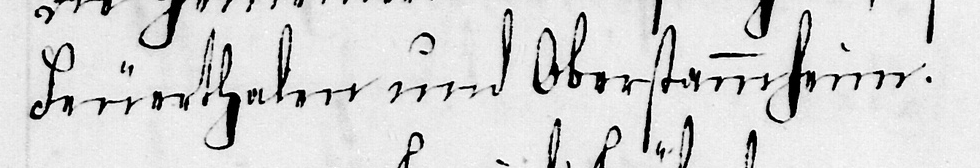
Feuerthalen und Oberstammheim.
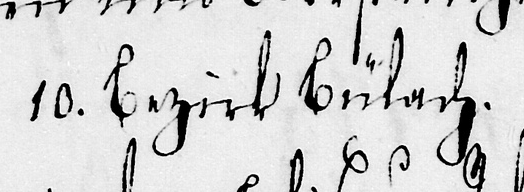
10. Bezirk Bülach.
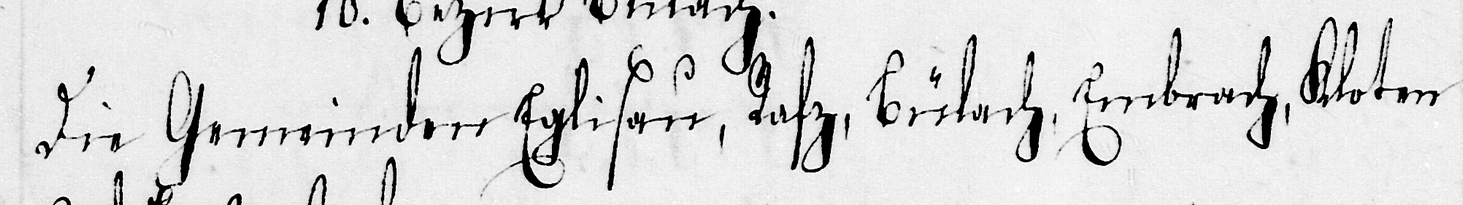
Die Gemeinden Eglisau, Rafz, Bülach, Embrach, Kloten
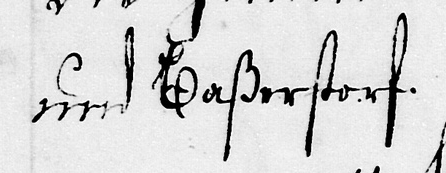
und Baßerstorf.
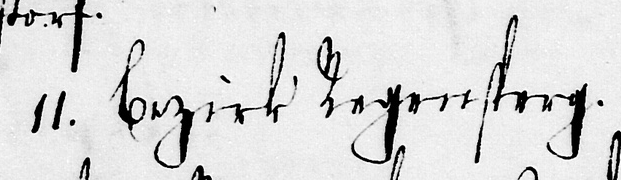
11. Bezirk Regensperg.
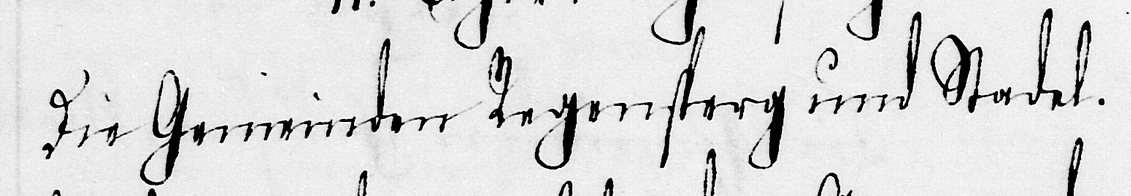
Die Gemeinden Regensperg und Stadel.
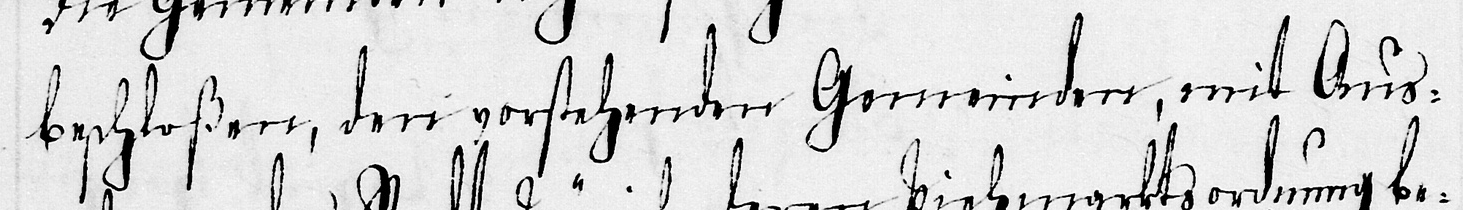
beschloßen, den vorstehenden Gemeinden, mit Aus¬
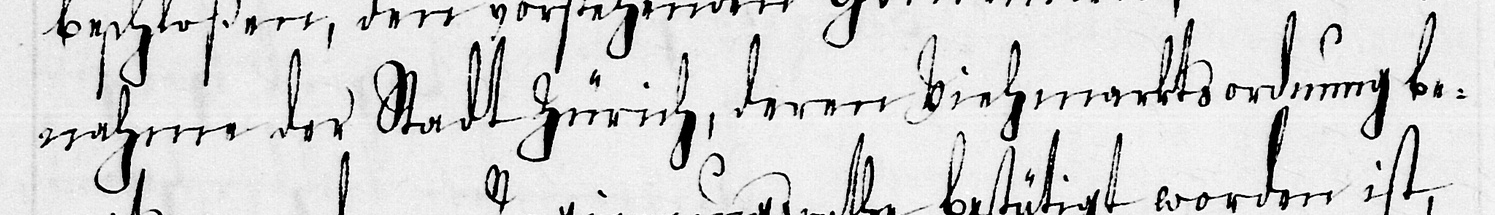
nahme der Stadt Zürich, deren Viehmarktsordnung be¬
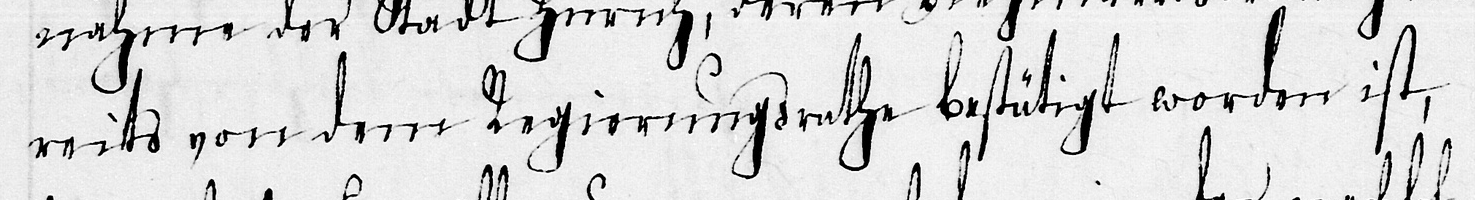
reits von dem Regierungsrathe bestätigt worden ist,
